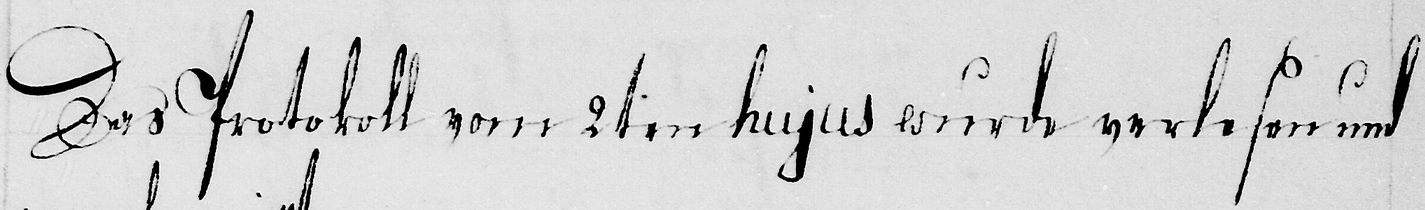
Das Protokoll vom 2ten hujus wurde verlesen und
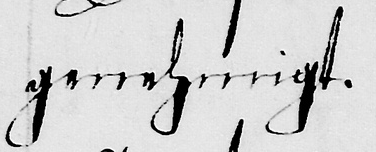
genehmigt.
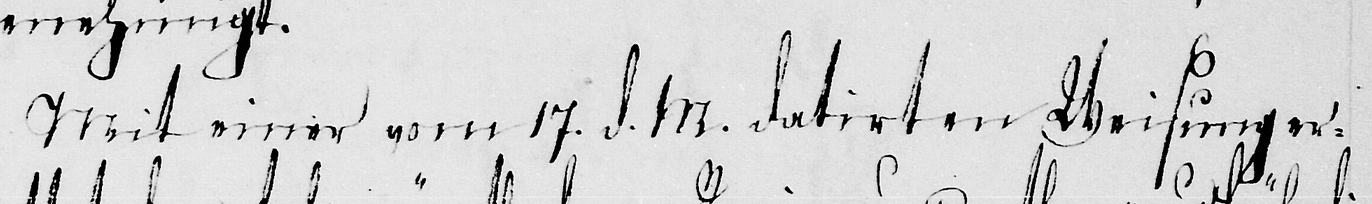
Mit einer vom 17 d. M. datirten Weisung ers¬
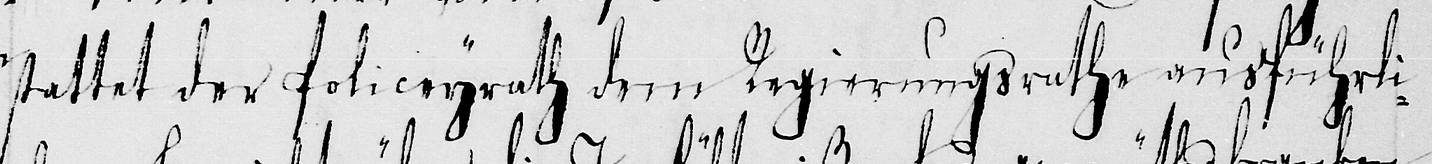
tattet der Policeyrath dem Regierungsrathe ausführli¬
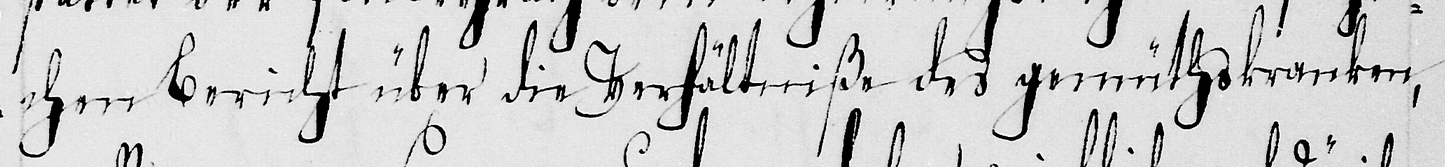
chen Bericht über die Verhältniße des gemüthskranken,
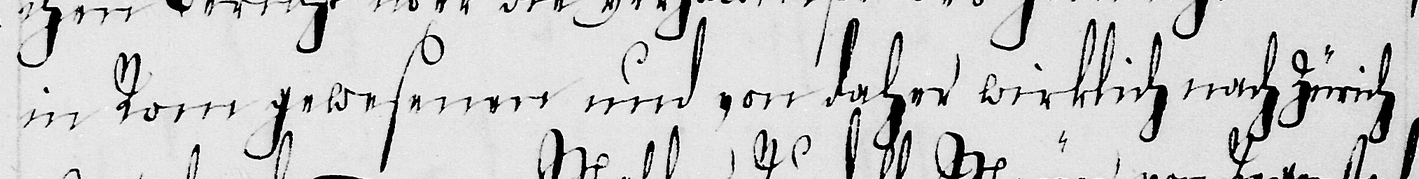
in Rom gewesenen und von daher wirklich nach Zürich
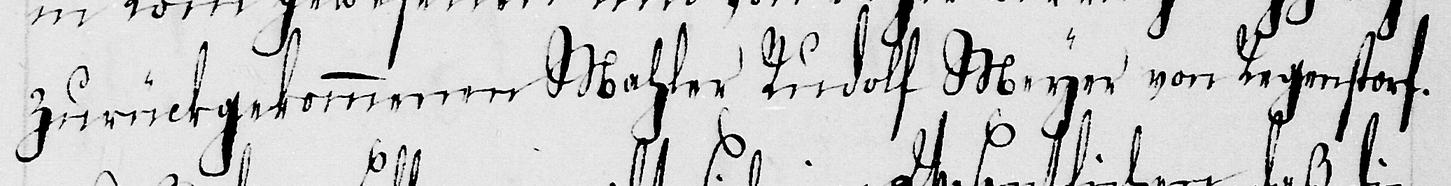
zurückgekommenen Mahler Rudolf Meyer von Regenstorf.
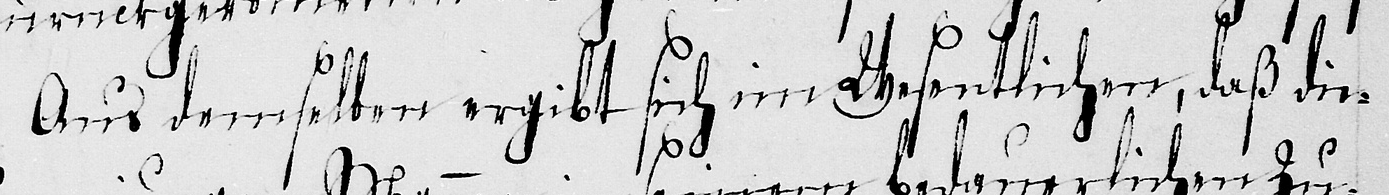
Aus demselben ergibt sich im Wesentlichen, daß die¬
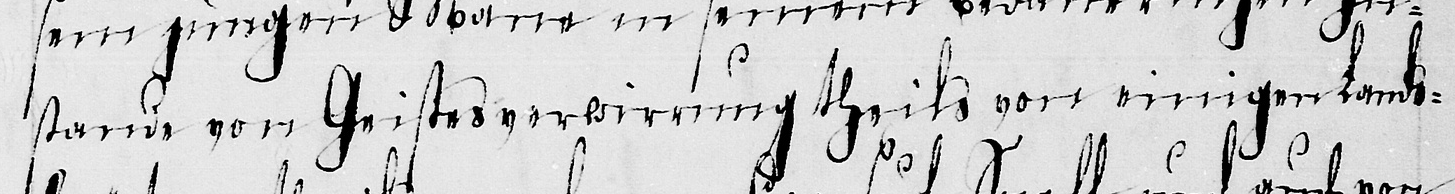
stande von Geistesverwirrung theils von einigen Lands¬
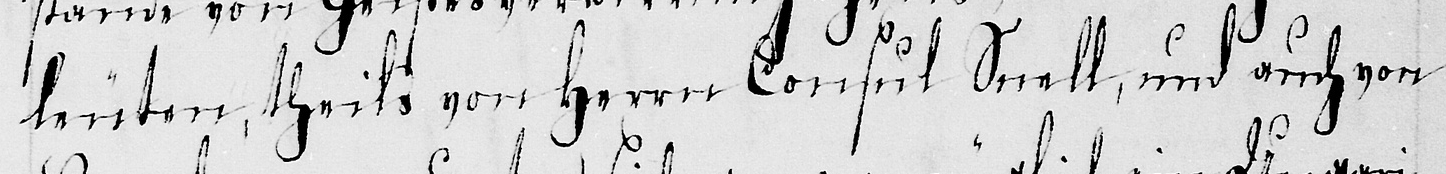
leuten, theils von Herrn Consul Snell, und auch von
